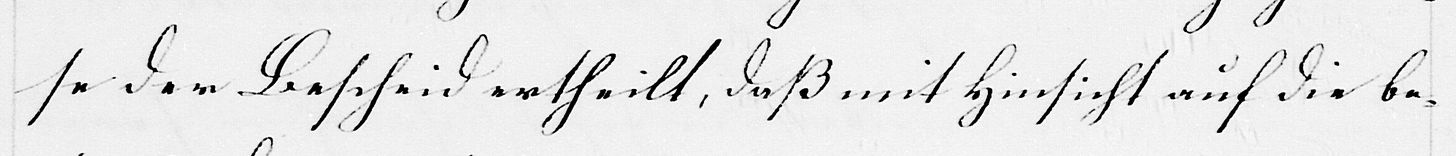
se der Bescheid ertheilt, daß mit Hinsicht auf die be¬
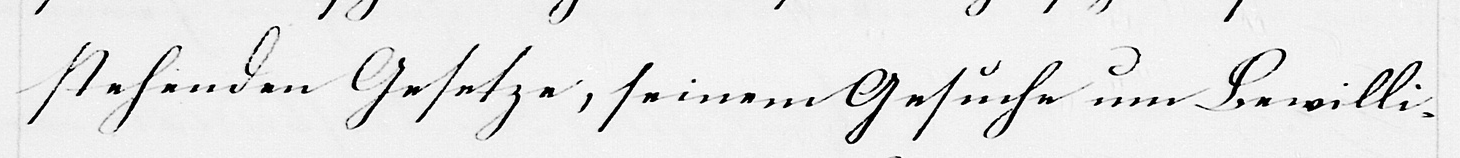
stehenden Gesetze, seinem Gesuche um Bewilli¬
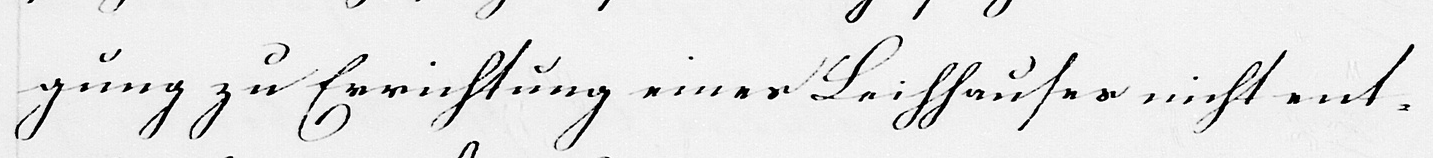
gung zu Errichtung eines Leihhauses nicht ent¬
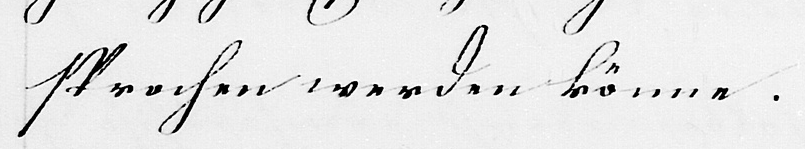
sprochen werden könne.
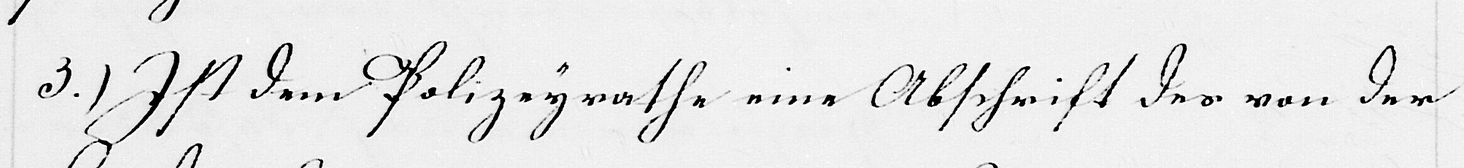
3.) Ist dem Polizeyrathe eine Abschrift des von der
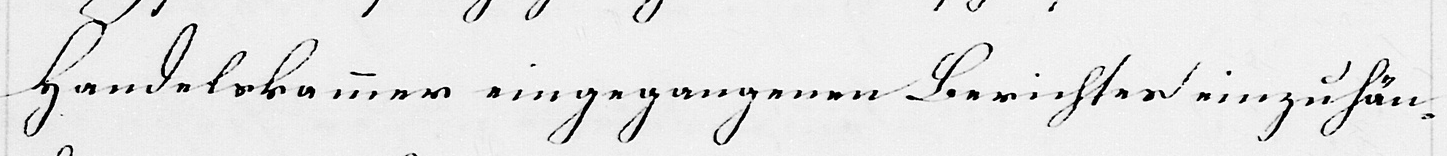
Handelskammer eingegangenen Berichtes einzuhän¬
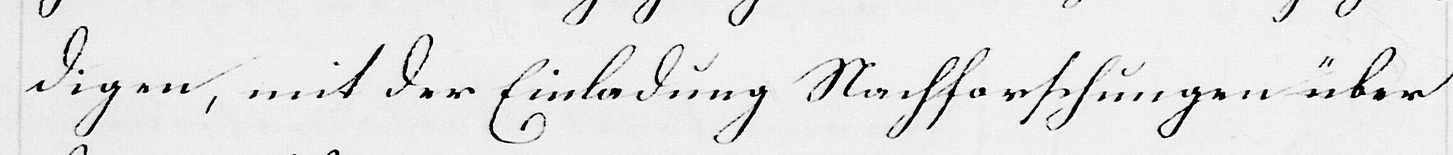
digen, mit der Einladung Nachforschungen über
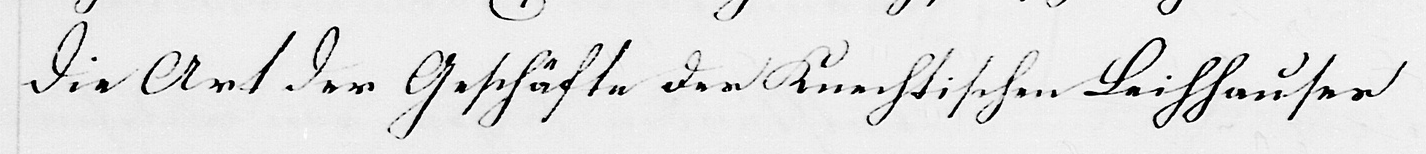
die Art der Geschäfte des Knechtischen Leihhauses
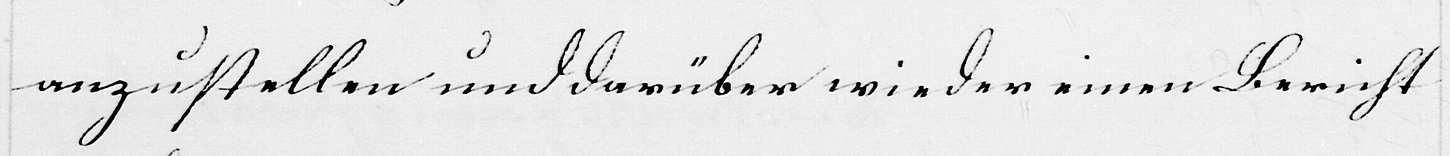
anzustellen und darüber wieder einen Bericht
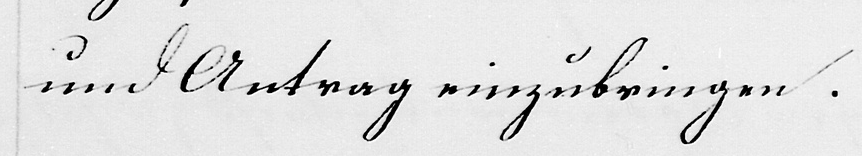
und Antrag einzubringen.
